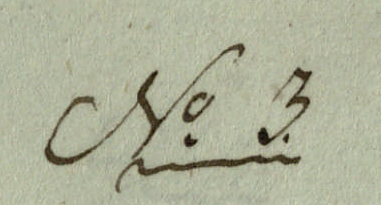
Nº. 3.
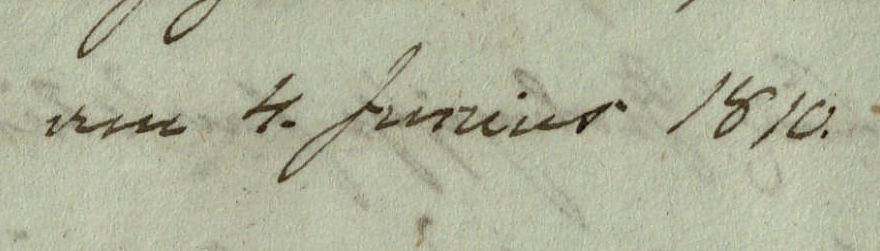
am 4. Junius 1810
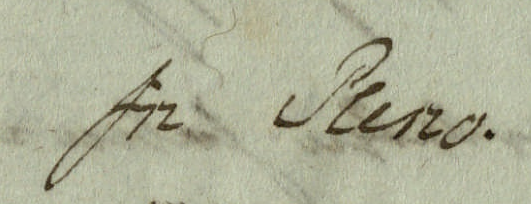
In Pleno.
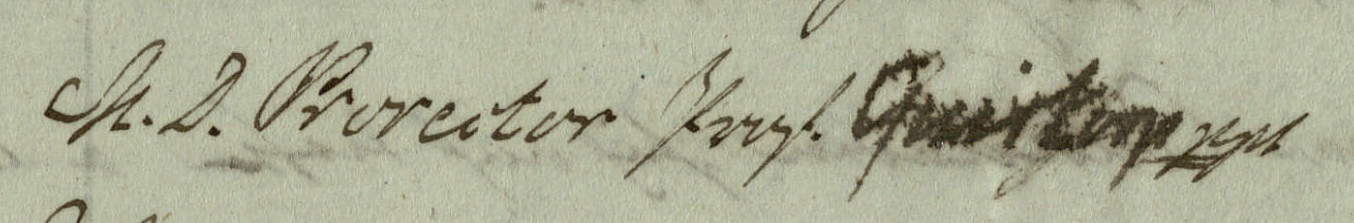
M. D. Prorector Prof. Quistorp ppt.
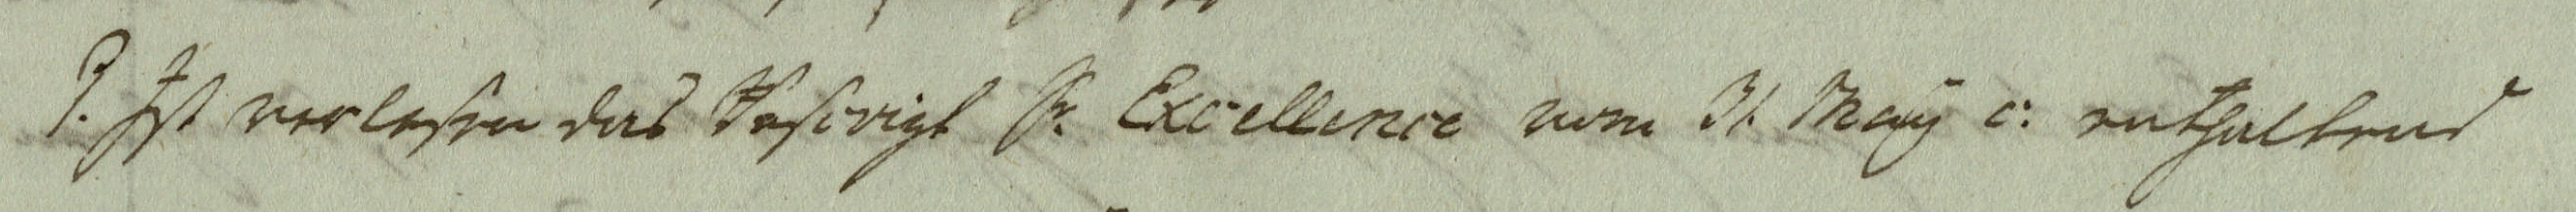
1. Ist verlesen das Rescript Sr. Excellence vom 31. Maÿ c. enthaltend
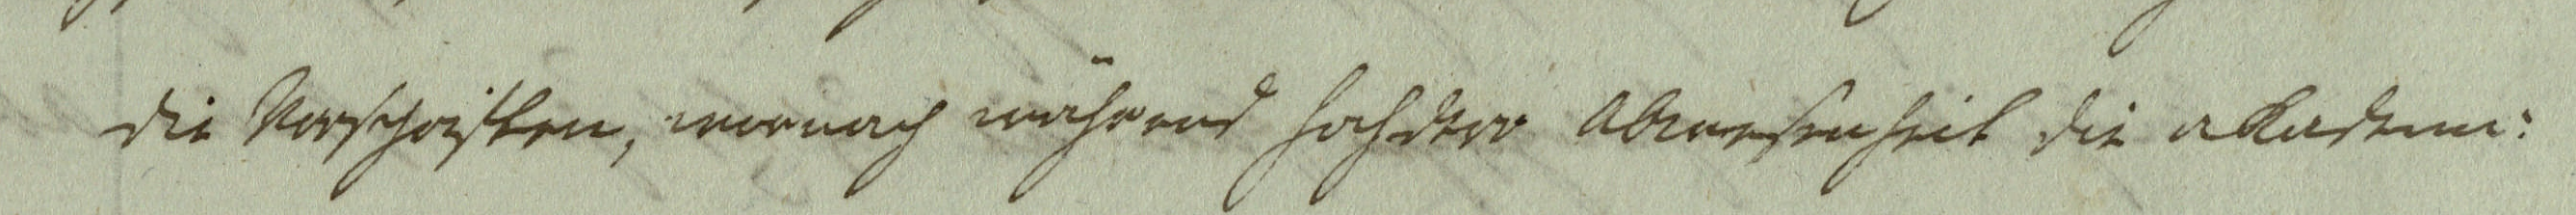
die Vorschriften, wonach während hochdero Abwesenheit die akademi¬
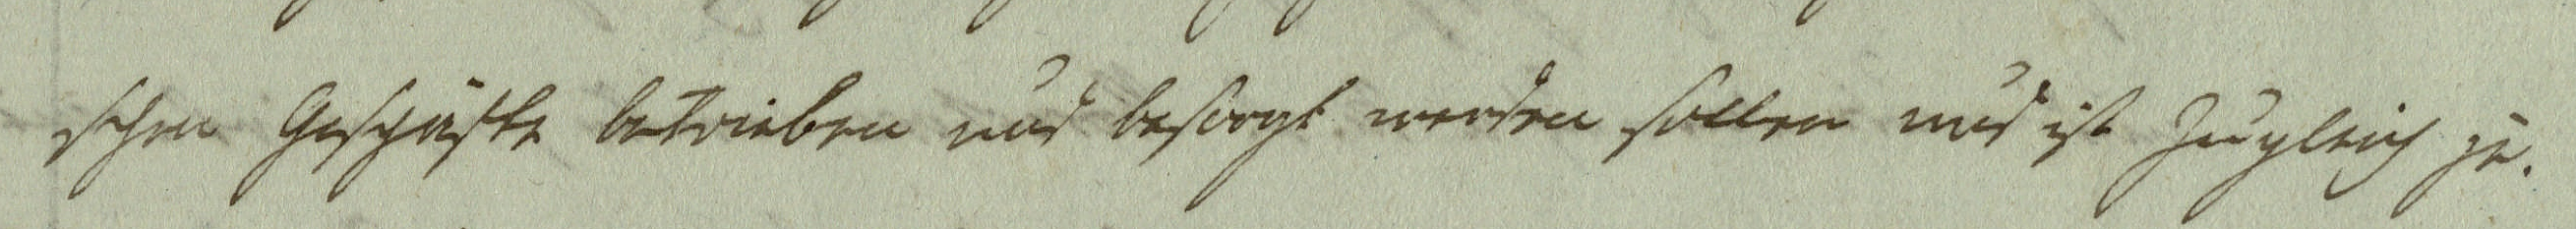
schen Geschäfte betrieben und besorgt werden sollen und ist zugleich je¬
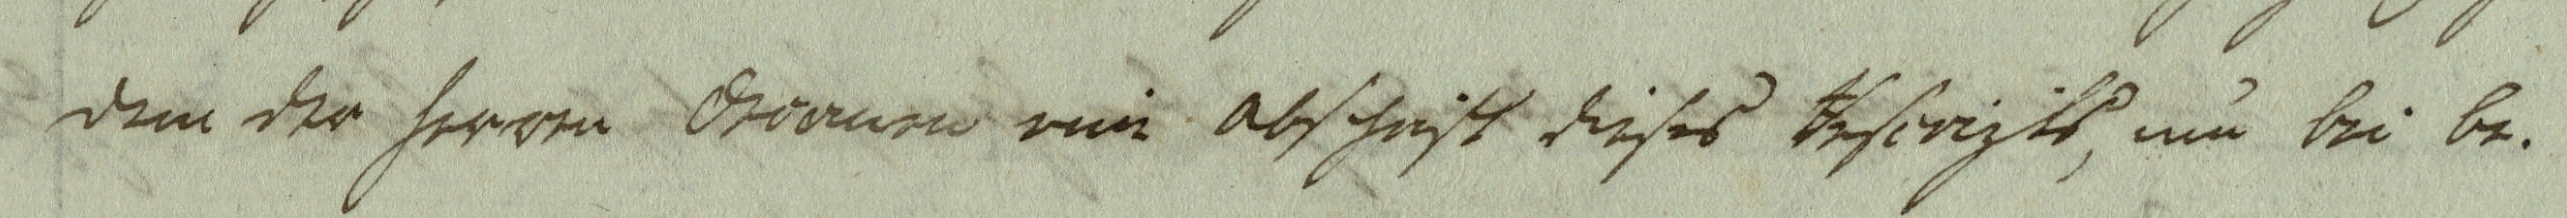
dem der herren Decanen eine Abschrift dieses Rescripts, um bei be¬
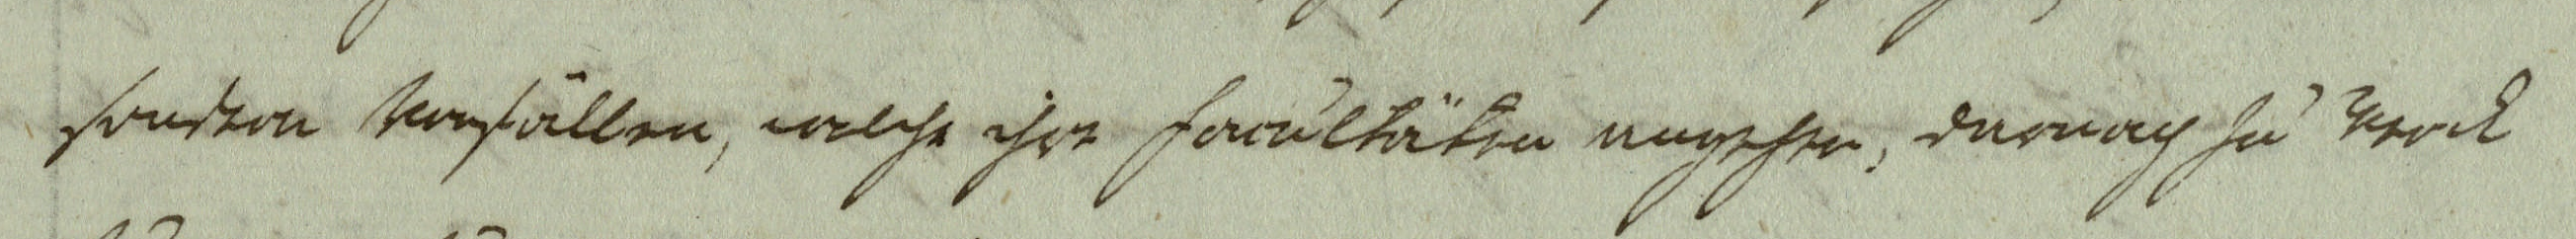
sondern Vorfällen, welche ihre Facultäten angehen, darnach zu Werck
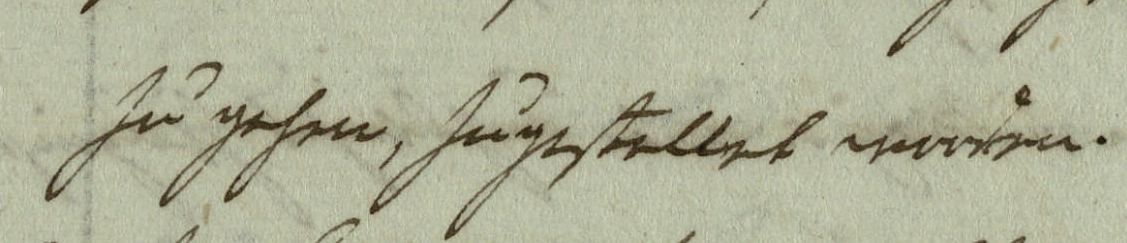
zu gehen, zugestellet worden.
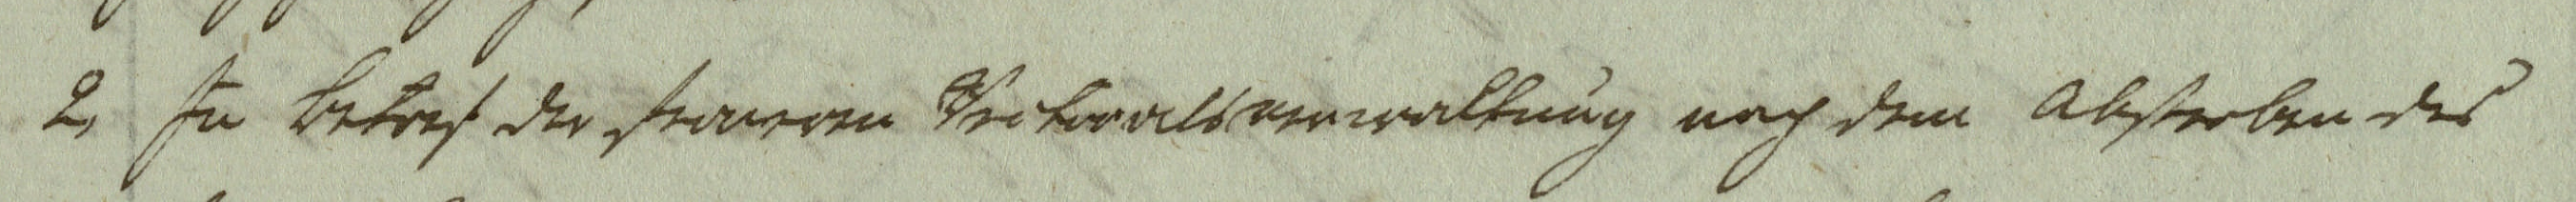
2. In betref der ferneren Rectoratsverwaltung nach dem Absterben des
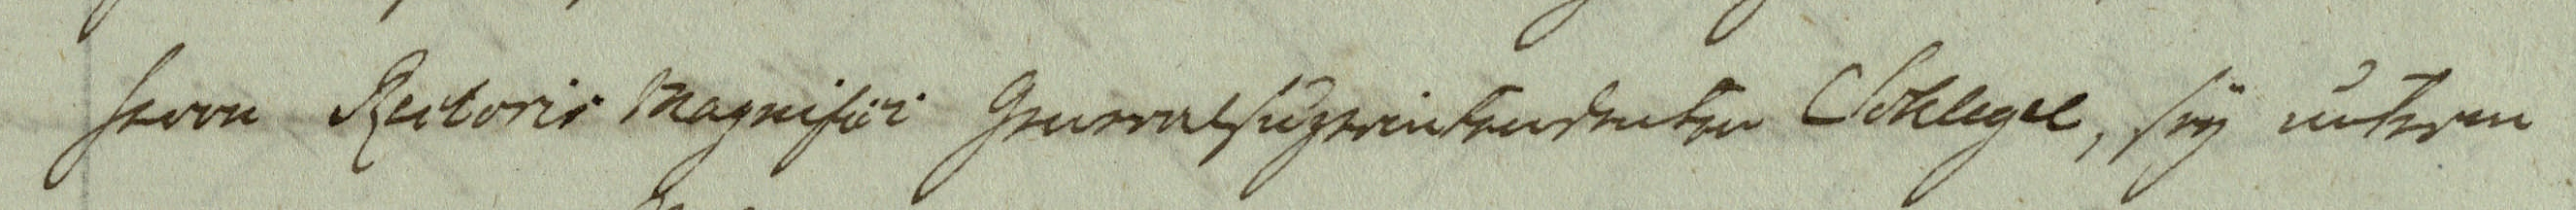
herrn Rectoris Magnifici Generalsuperintendenten Schlegel, seÿ unterm
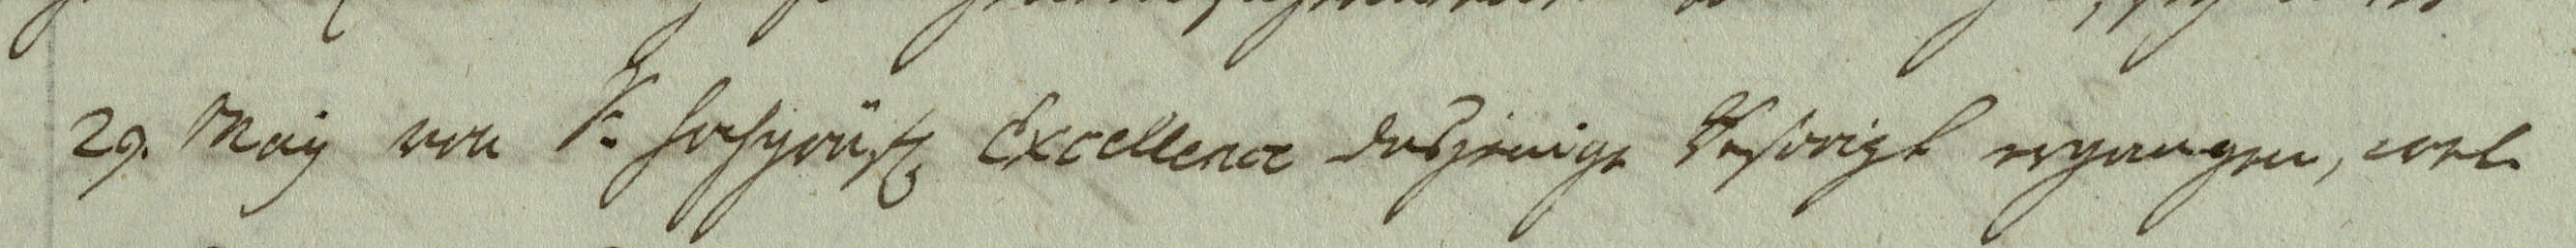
29. Maÿ von Sr. hochgräfl. Excellence dasjenige Rescript ergangen, wel¬
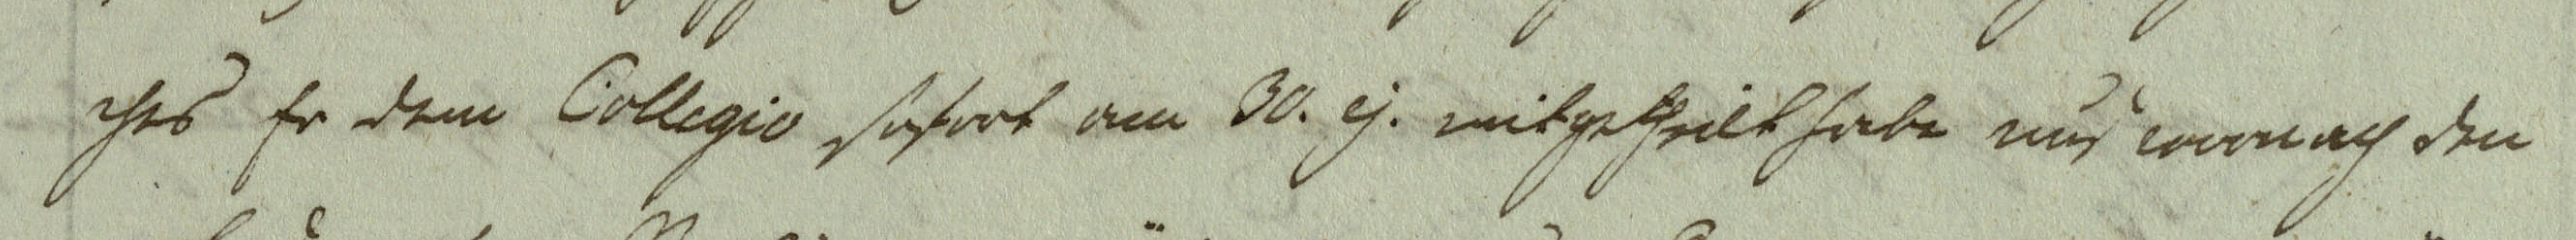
ches Er dem Collegio sofort am 30. ej. mitgetheilt habe und wornach den
